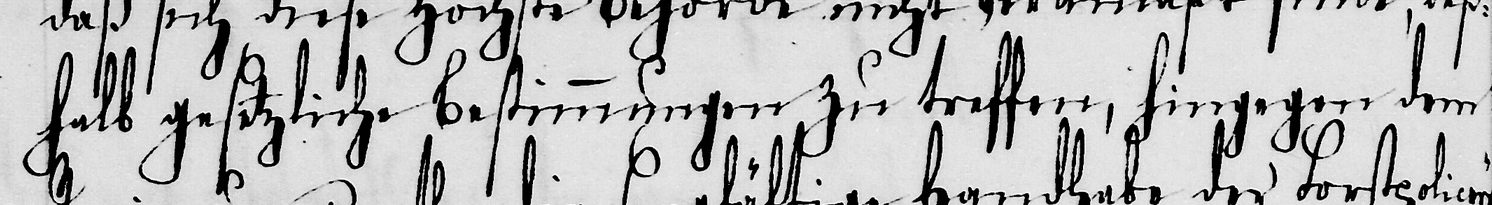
gesetzliche Bestimmungen zu treffen, hingegen dem
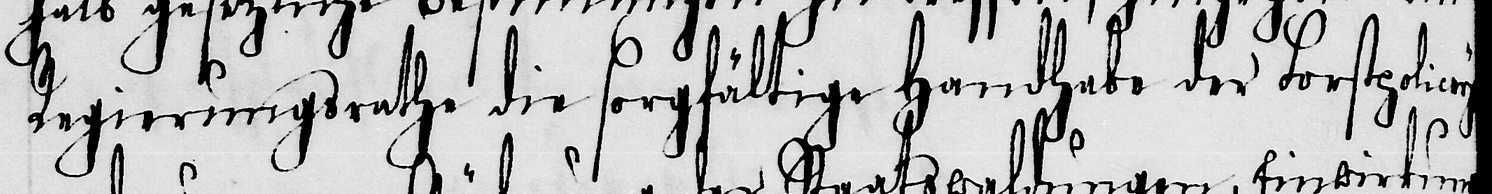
Regierungsrathe die sorgfältige Handhabe der Forstpoli¬
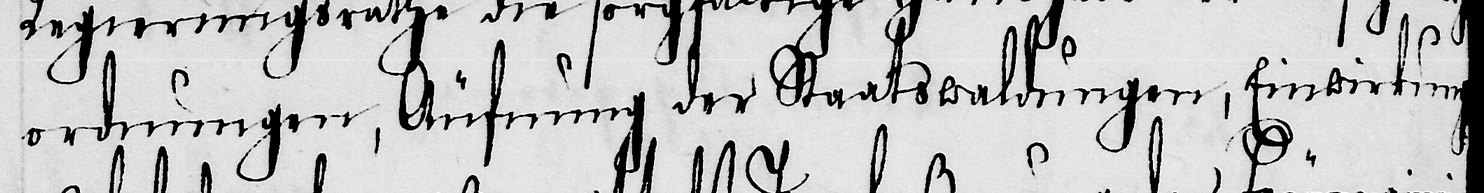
ordnungen, Äufnung der Staatswaldungen, Einwirkung
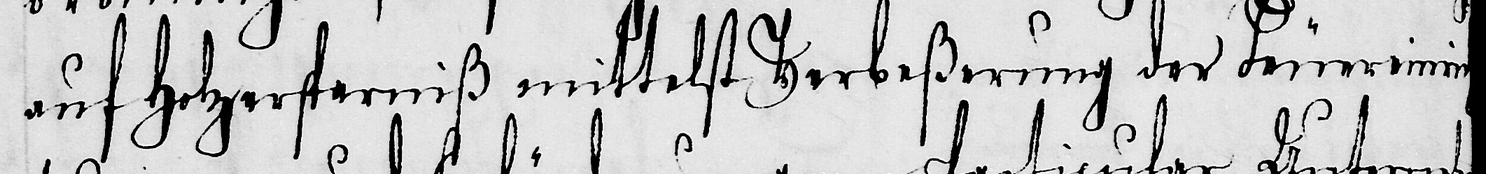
auf Holzersparniß mittelst Verbeßerung der Feuerein¬
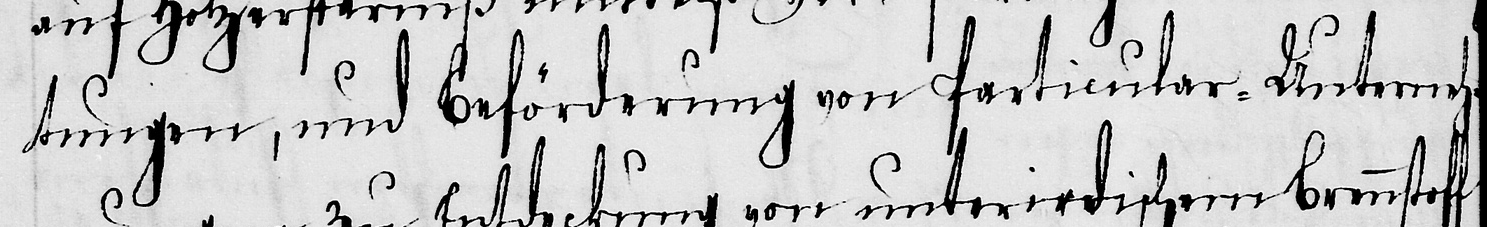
tungen, und Beförderung von Particular-Unterne¬
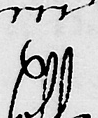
rich¬
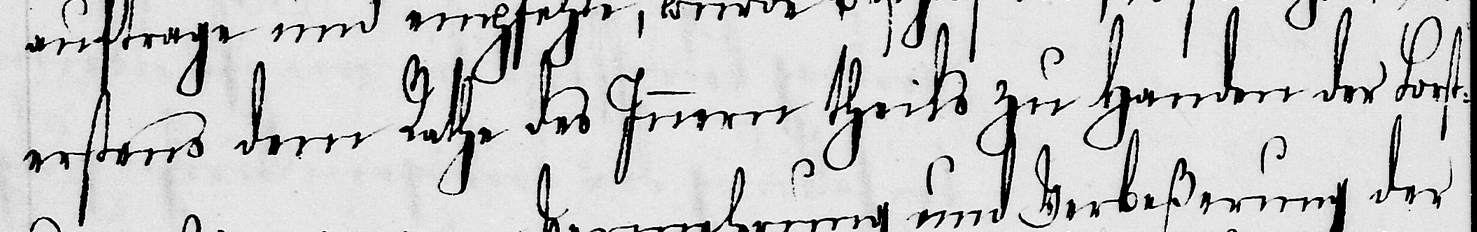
erstens dem Rathe des Innern theils zu Handen der Fo¬
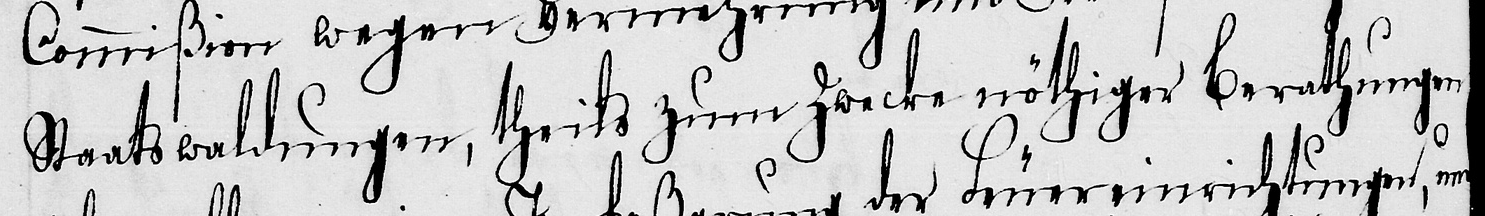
Staatswaldungen, theils zum Zwecke nöthiger Berathungen
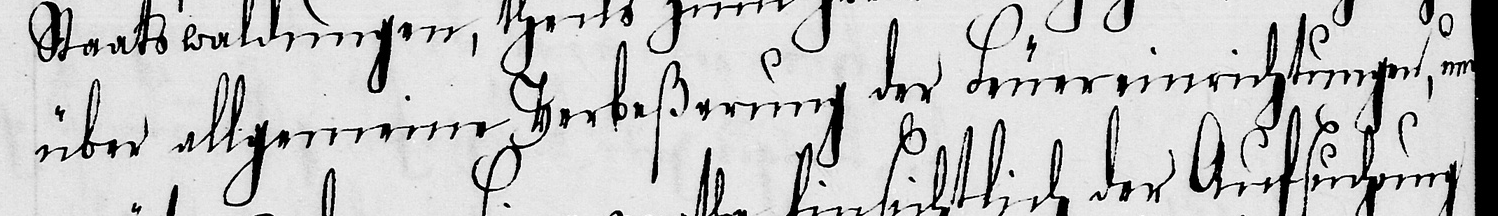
über allgemeine Verbeßerung der Feuereinrichtungen,
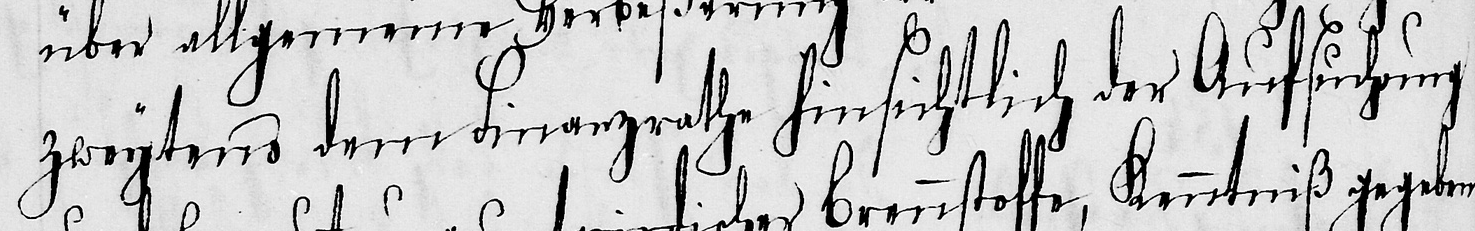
zweytens dem Finanzrathe hinsichtlich der Aufsuchung
